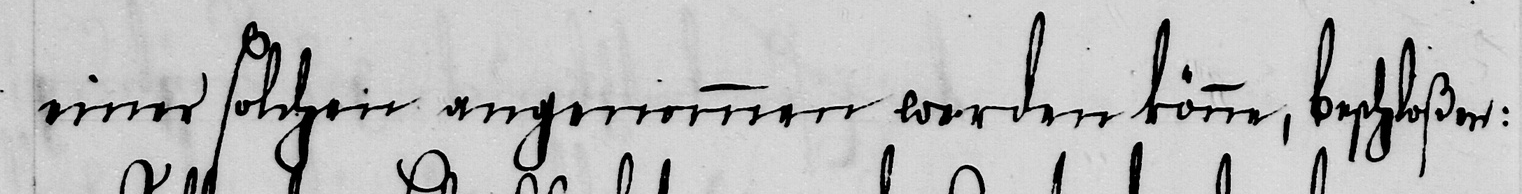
einer solchen angenommen werden könne, beschloßen:
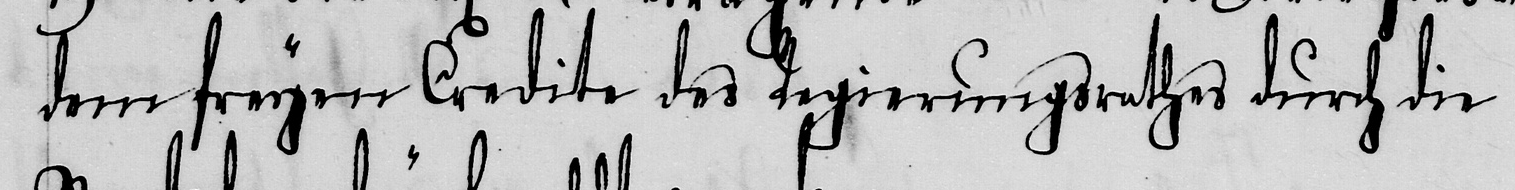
dem freyen Credite des Regierungsrathes durch die
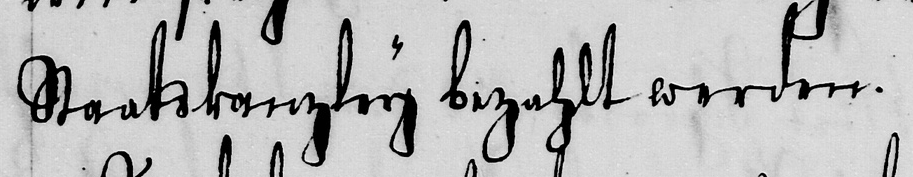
Staatskanzley bezahlt werden.
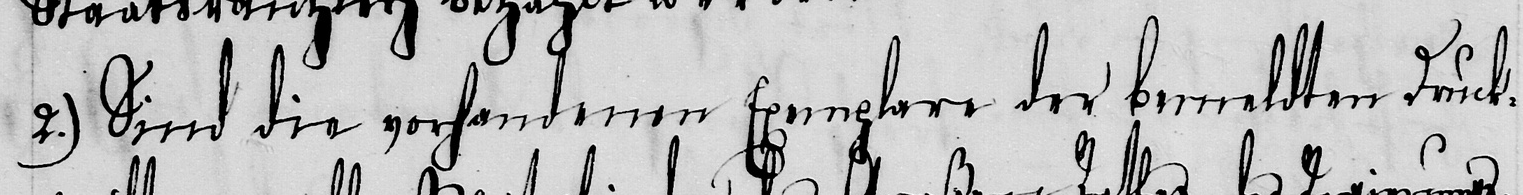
2.) Sind die vorhandenen Exemplare der bemeldten Druck¬
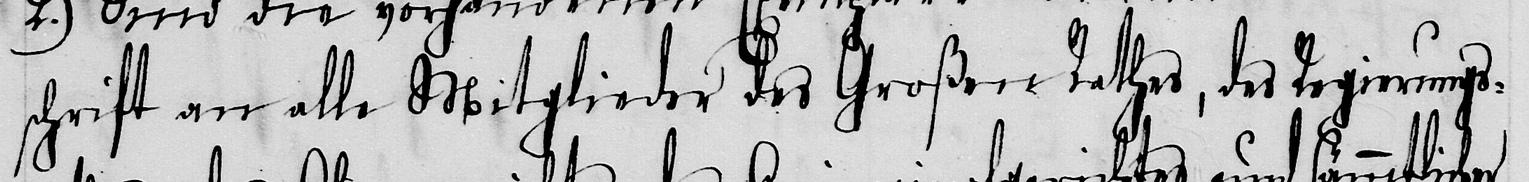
schrift an alle Mitglieder des Großen Rathes, des Regierungs¬
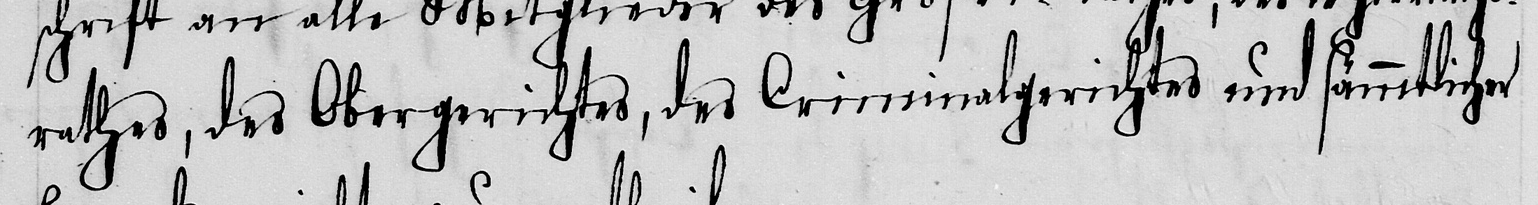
rathes, des Obergerichtes, des Criminalgerichtes und sämmtlich¬
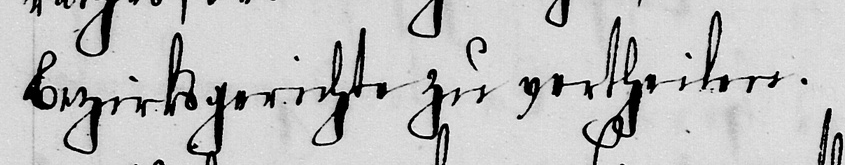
Bezirksgerichte zu vertheilen.
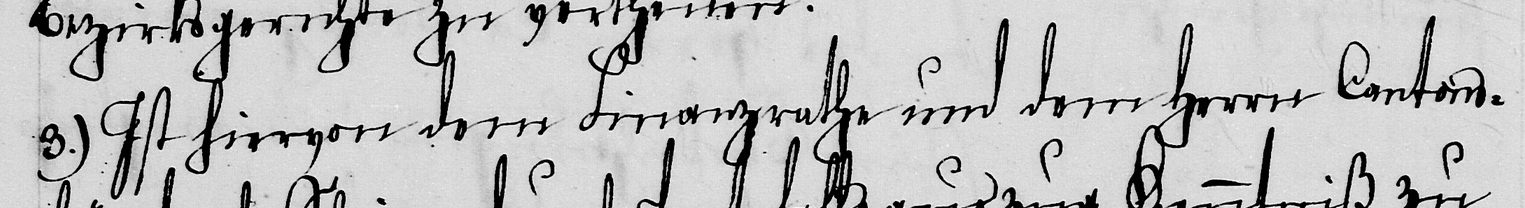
3.) Ist hiervon dem Finanzrathe und dem Herrn Cantons¬
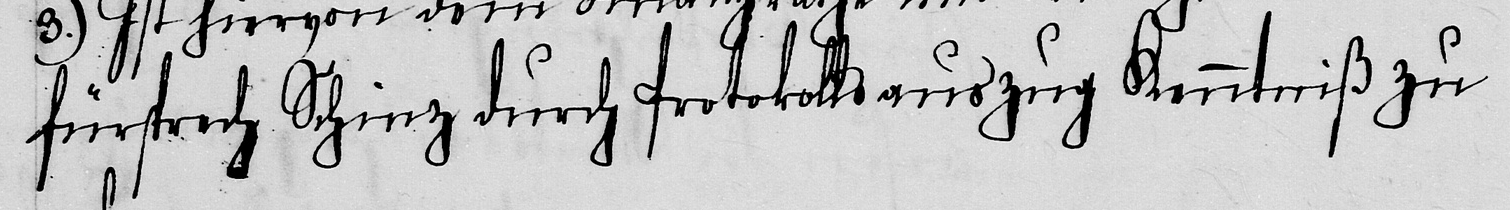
fürsprech Schinz durch Protokollsauszug Kenntniß zu
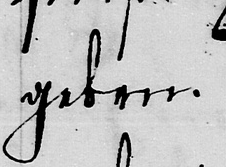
geben.
